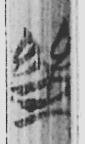𪪋（哉）
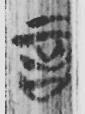言
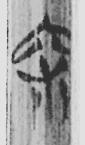罙
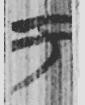于
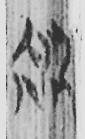𣶒
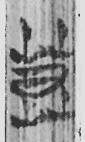莫
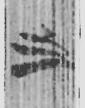之
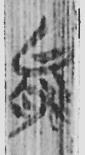能
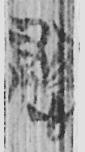惻
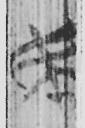民
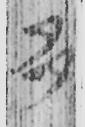多
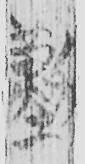勤
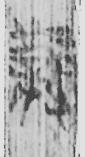戁
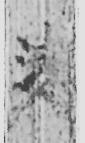我
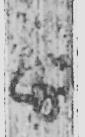心
